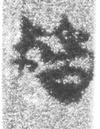○（造）
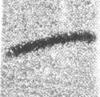一
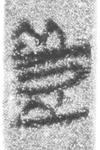良
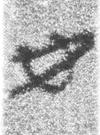女
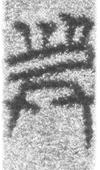○（乘）
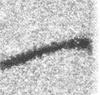一
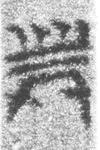○（乘）
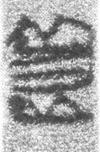良
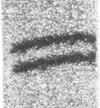二
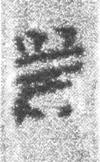乘
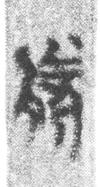○（繸）
